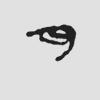月
